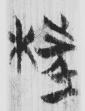{木㞷}
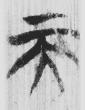天
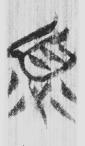寡
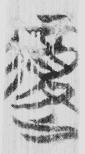復
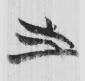之
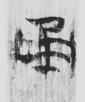甬
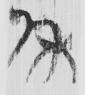休
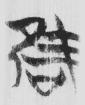唯
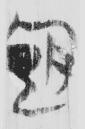侌
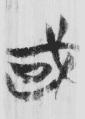或
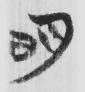明
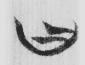曰
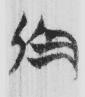於
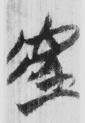𫊟
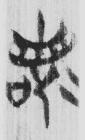若
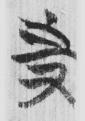寺
